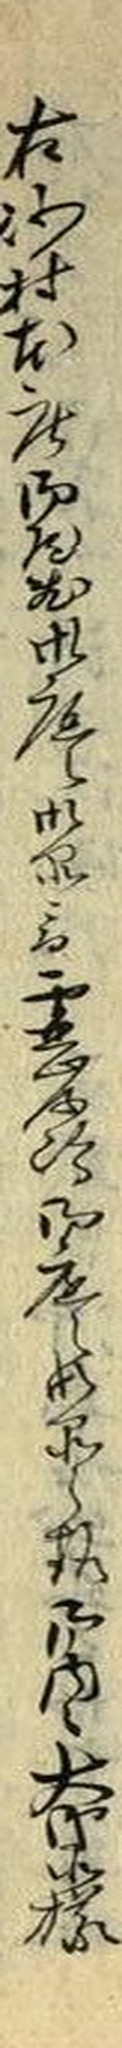右砂村本庄御屋敷御庭之御品ニ而霊岸島御庭之御品之趣御内々大御所様
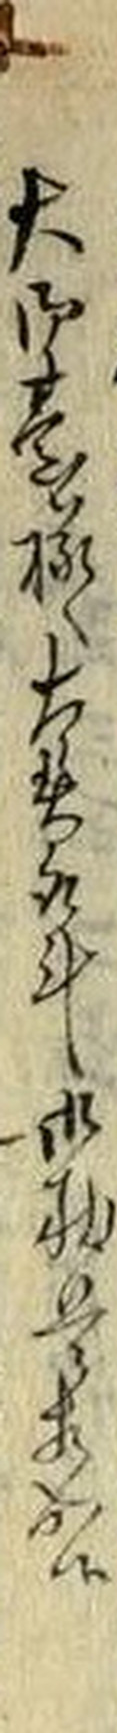大御台様へ大奥取斗御献上ニ相成候
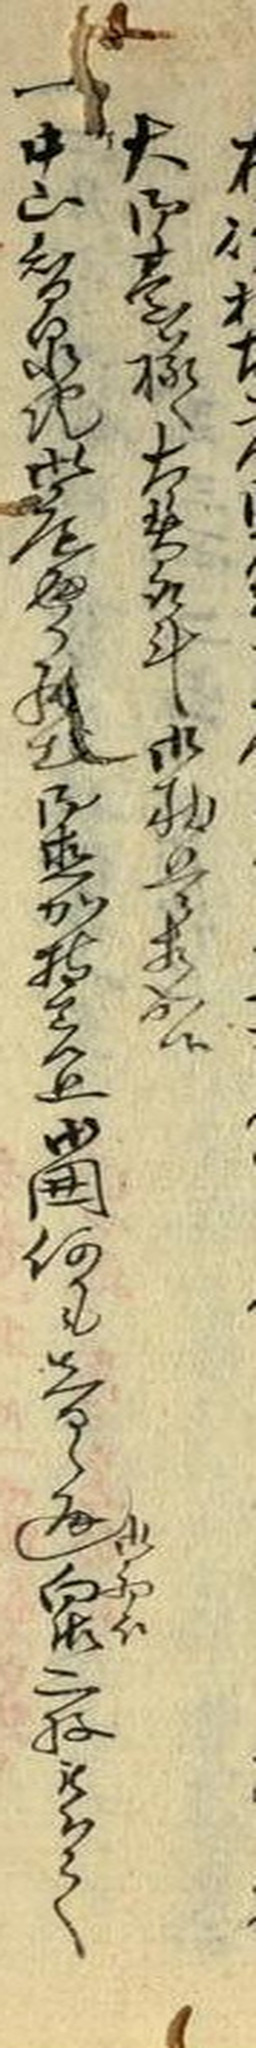一中山智泉院御庭通り罷出御直加持差上御囲何も先日之通御初ほ白銀二枚被下之
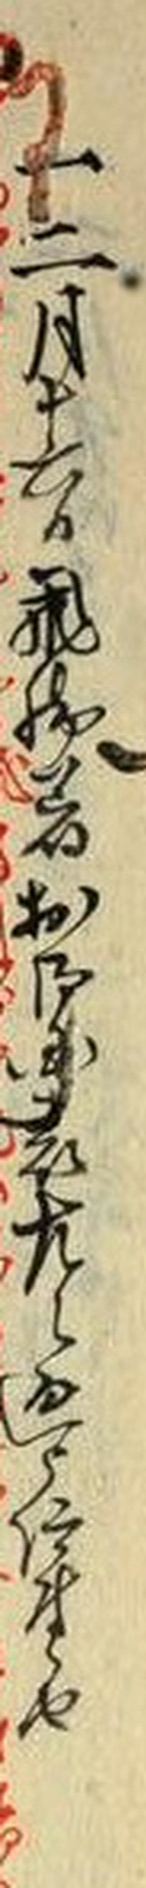一二月十六日飛脚着於御国表左之通可被仰付候由
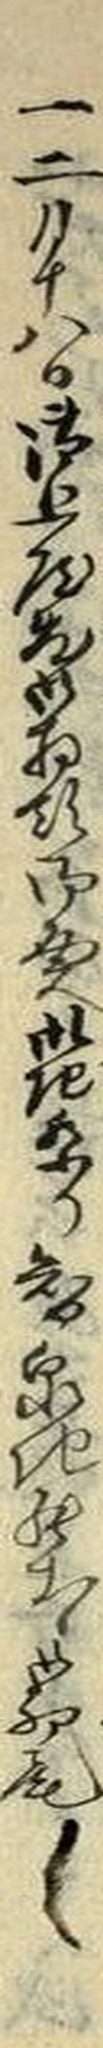一二月十八日御上屋敷御拝領御殿御地祭り智泉院罷出候御初尾
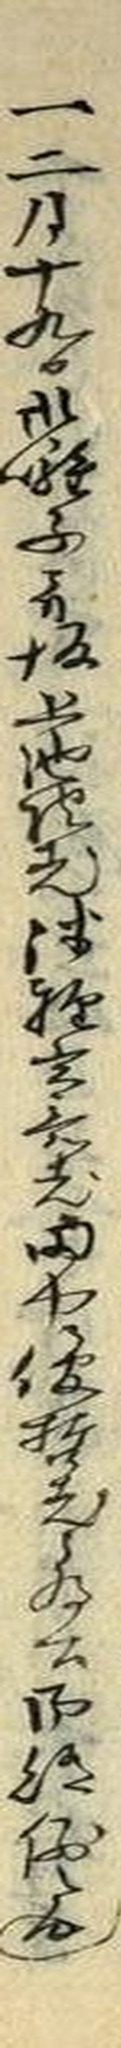一二月十九日御囃子ニ付坂上池院老津軽玄意老田中俊哲老被為召御賄例之通
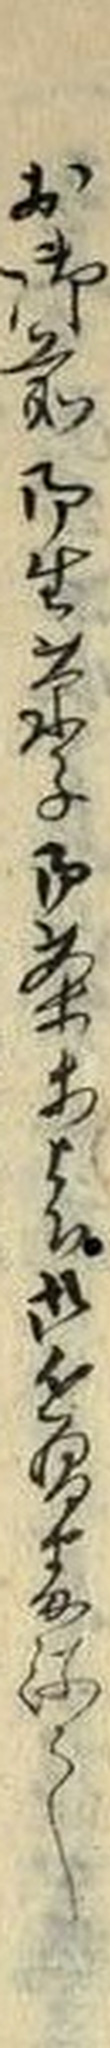於御前御生菓子御茶等被下御近習番役之
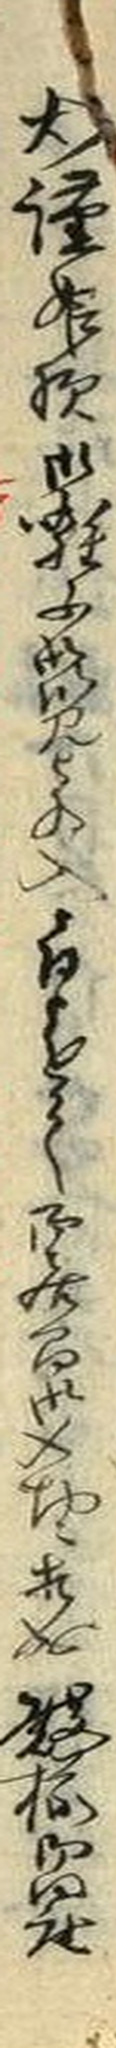右謹姫様御囃子御覧被為入ニ付被進之御居間御〆切ニ相成殿様御同座
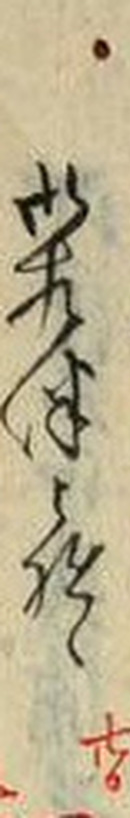御相伴被遊候
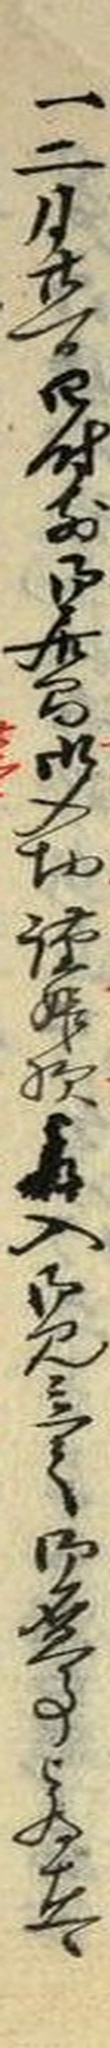一二月廿一日四時前御居間御〆切謹姫様被為入御見立之盃事被為在候
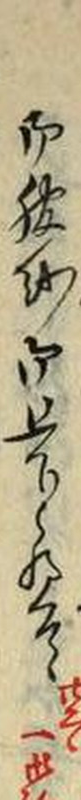御服紗御上下被為召候
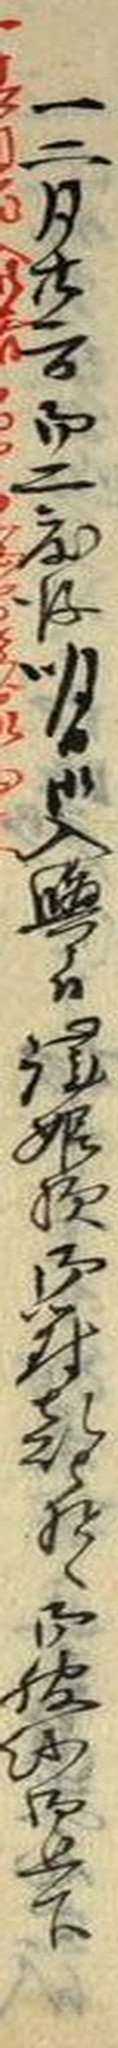一二月廿二日御二度後明日御入輿ニ付謹姫様御対顔被遊候御服紗御上下
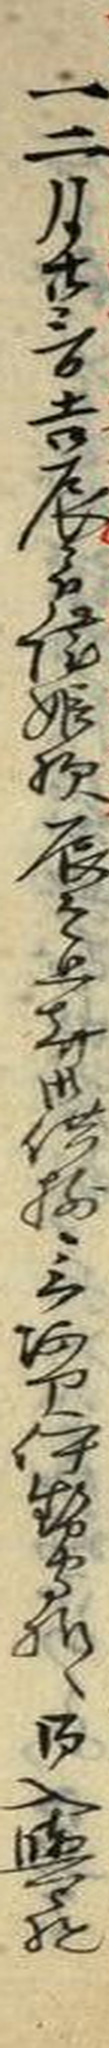一二月廿三日吉辰ニ付謹姫様辰之上刻御供揃ニ而阿部伊勢守様へ御入輿可被遊

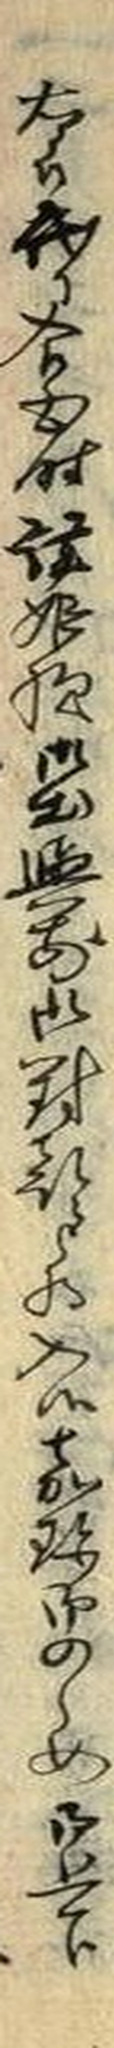右ニ付代り合五時謹姫様御出輿前御対顔被為入候嘉珎御のしめ御上下
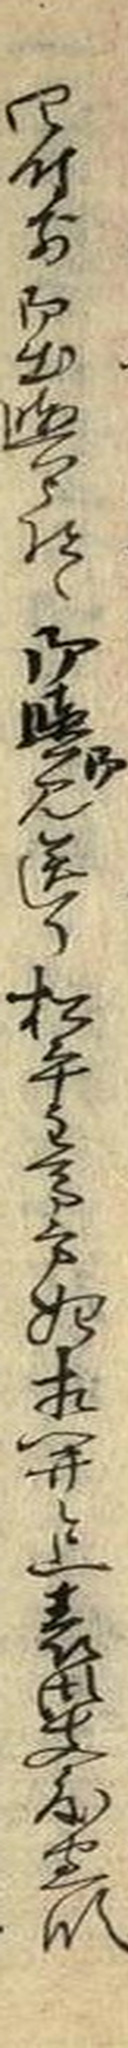四時前御出輿被遊候御輿御見送り松平主馬方始相開候上表御支度宣段
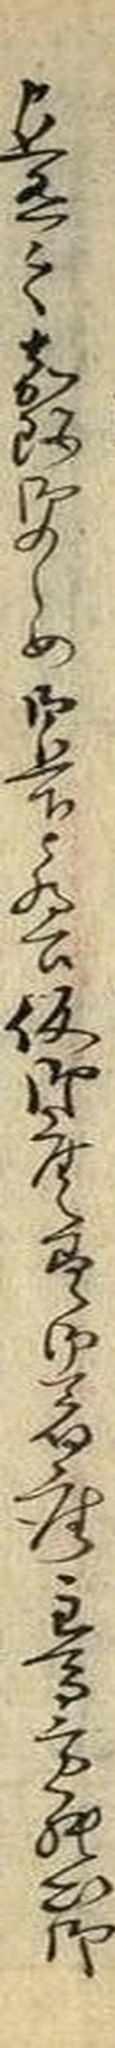申上有之嘉珎御のしめ御上下被為召仮御座之間御着座主馬方罷出御
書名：少傅日録抄（斉善付側向頭取日記、江戸并道中、初入在国、逝去後…
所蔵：福井県文書館 Fukui Prefectural Archives
